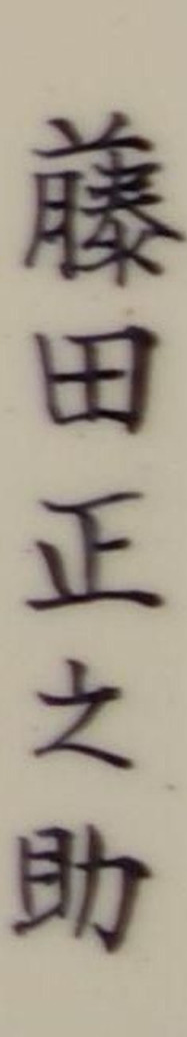藤田正之助
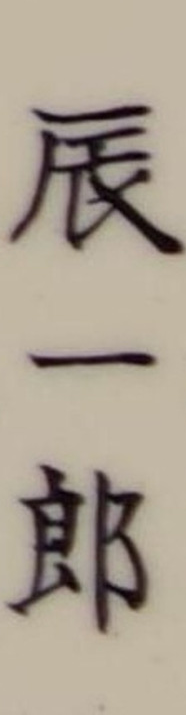辰一郎
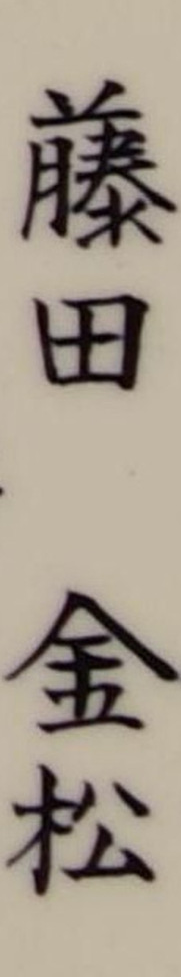藤田金松
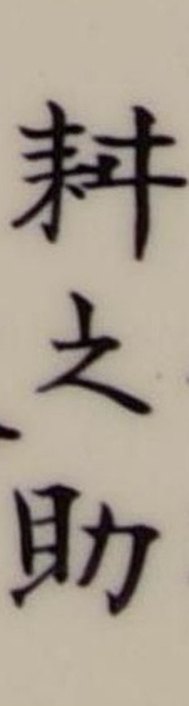耕之助
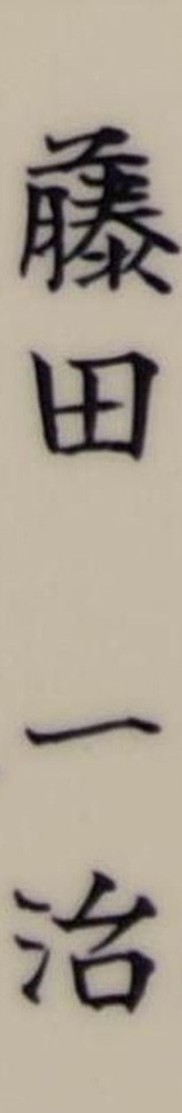藤田一治
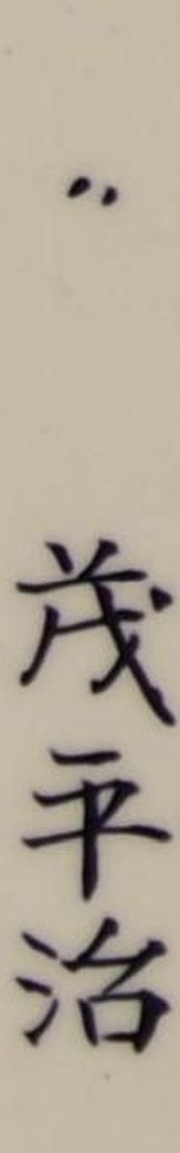茂平治
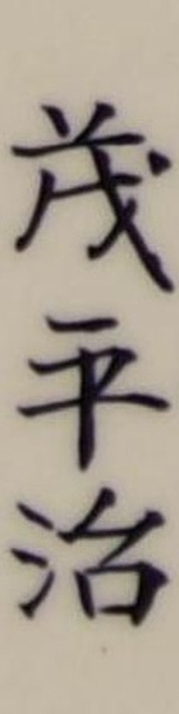茂平治
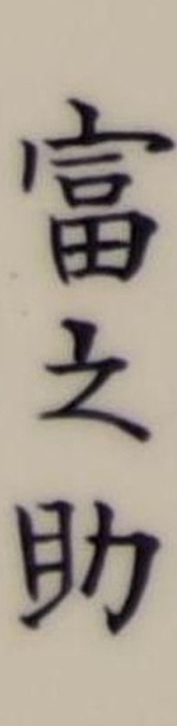富之助

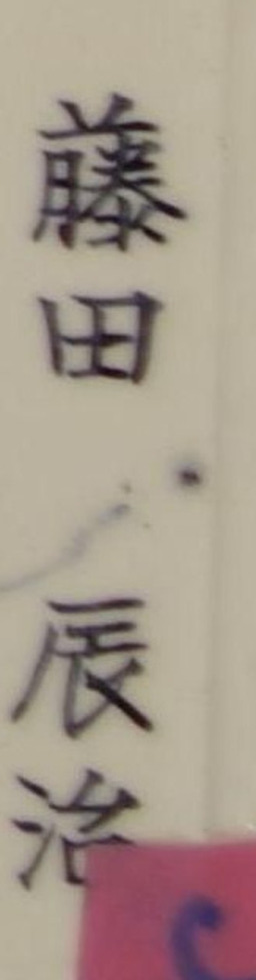藤田辰治
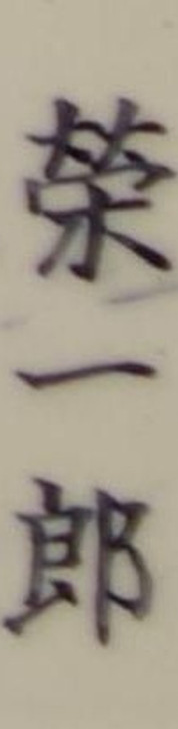榮一郎
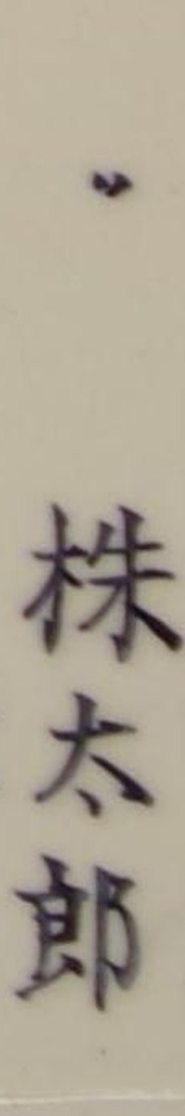株太郎
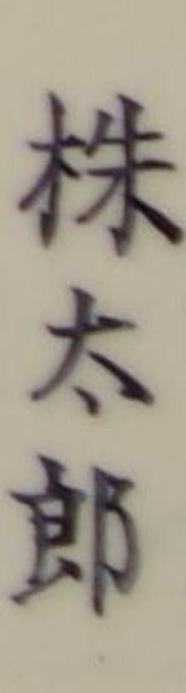株太郎
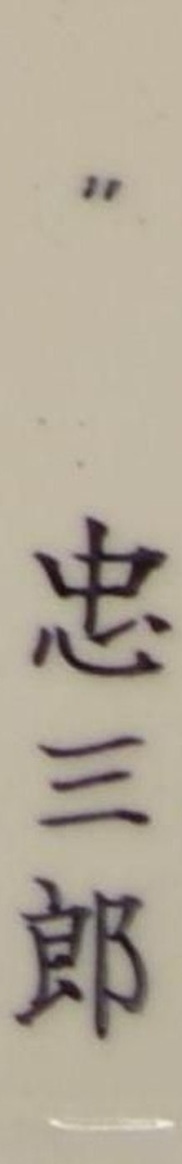忠三郎
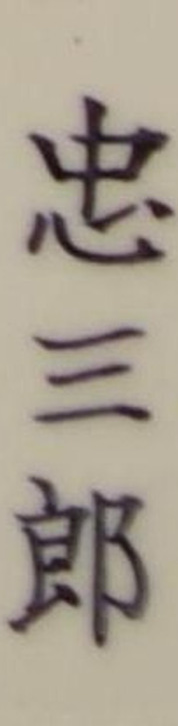忠三郎
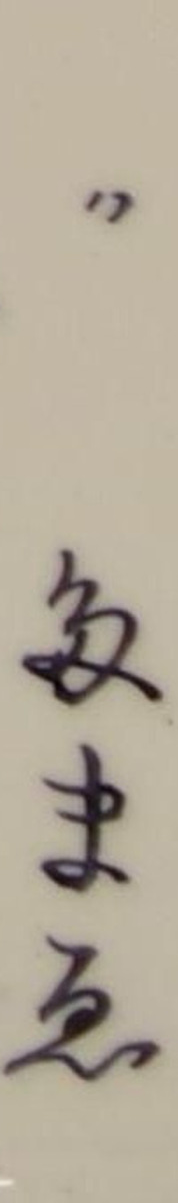たまえ
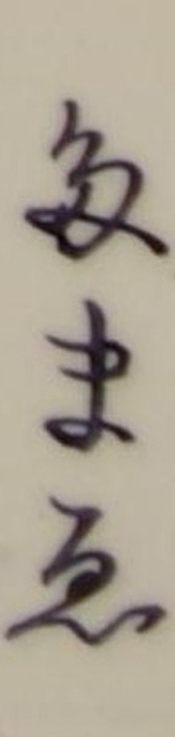たまえ
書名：E~L
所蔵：高野山金剛峯寺
